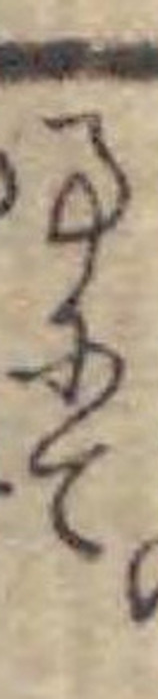事にて
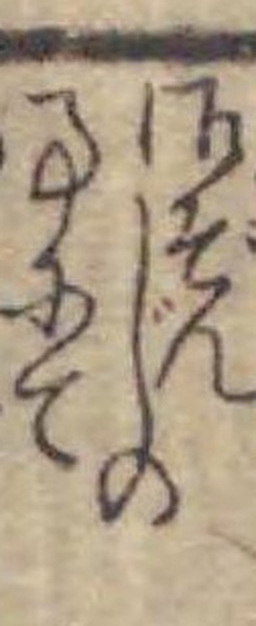事にて
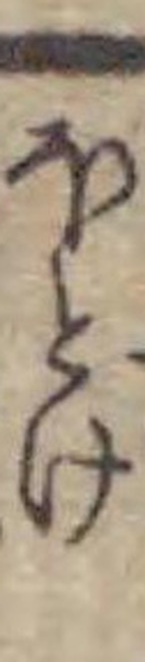ほとけ
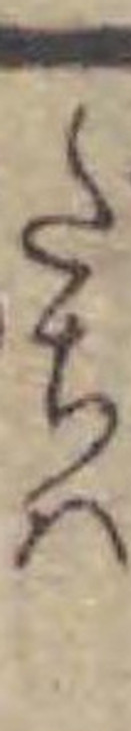たちは
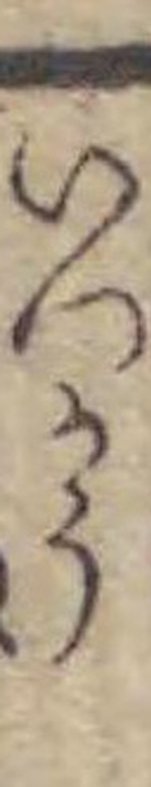いつかう
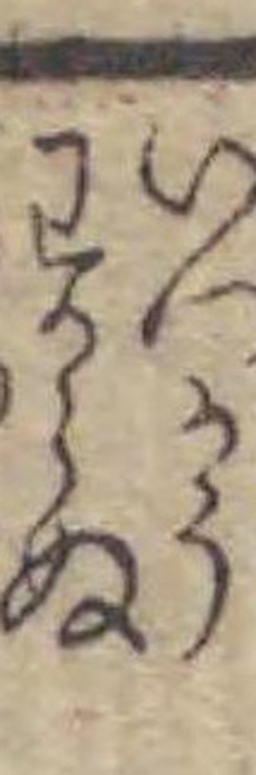わからぬ
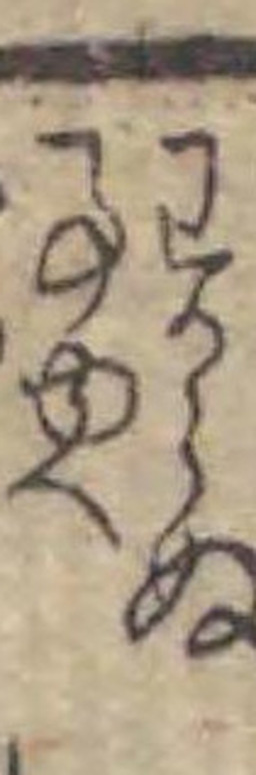事ゆへ
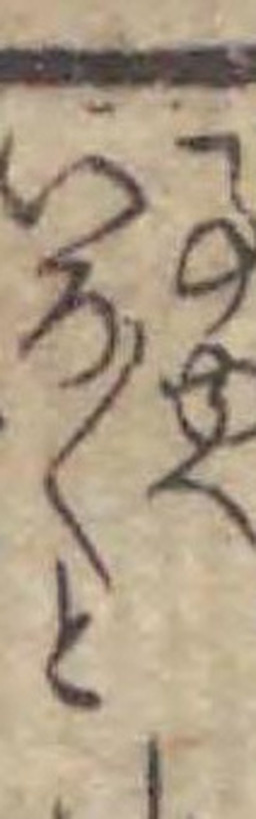いろ〳〵と
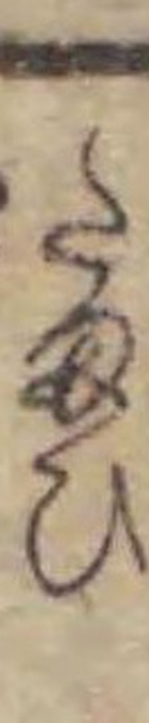たまひ
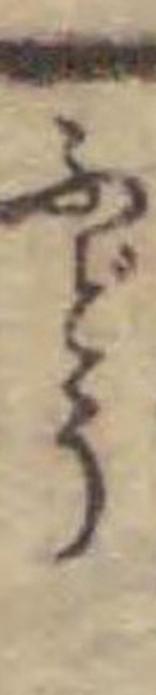ふどう
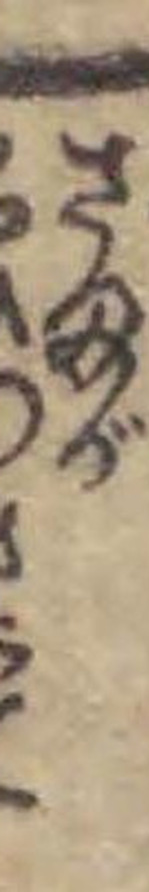さまが
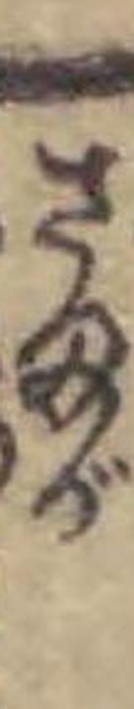さまが
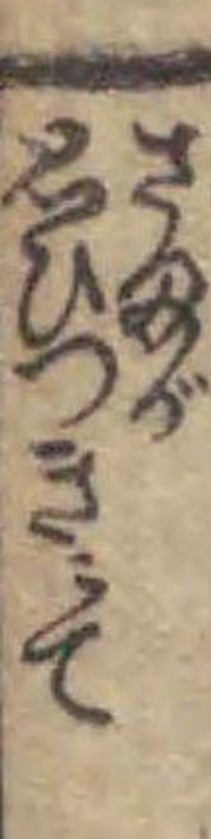思ひつきにて
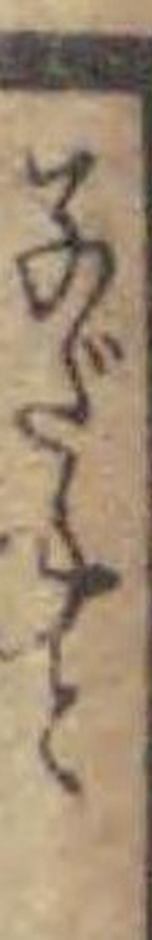子だねと
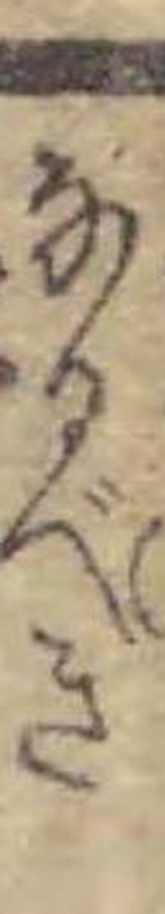なるべき
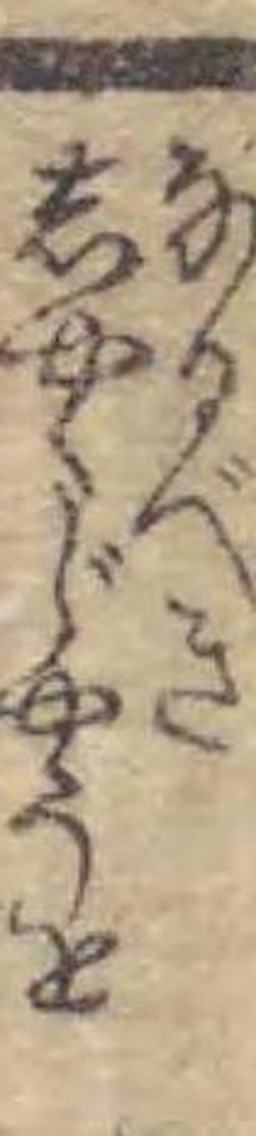しやくじやうを
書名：奇妙頂礼胎錫杖 : 3巻
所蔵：国立国会図書館 National Diet Library, JAPAN
